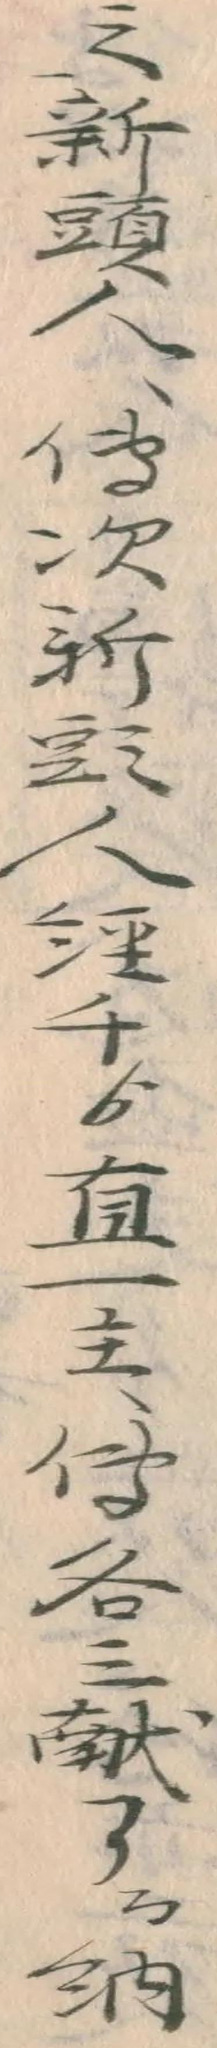之新頭人へ傳次新頭人経千ゟ直一主へ傳各三献了而納
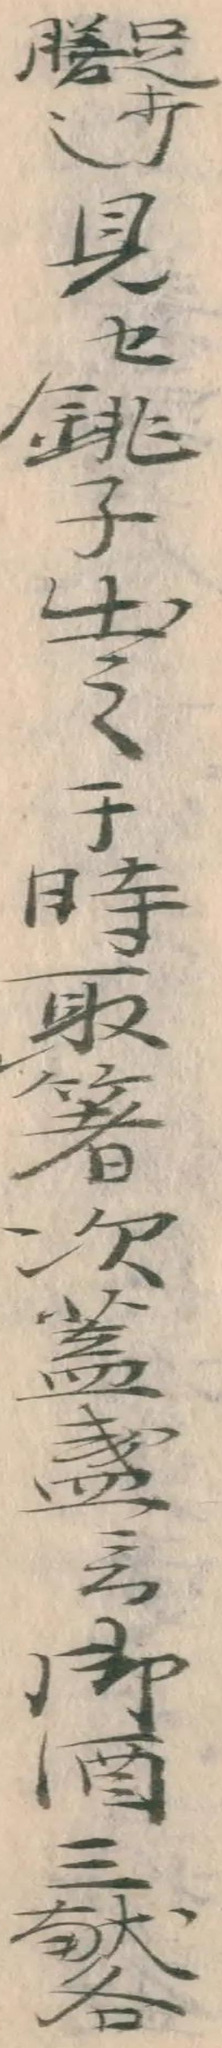足打膳也見セ銚子出之于時取箸次蓋盞ニ而御酒三献各
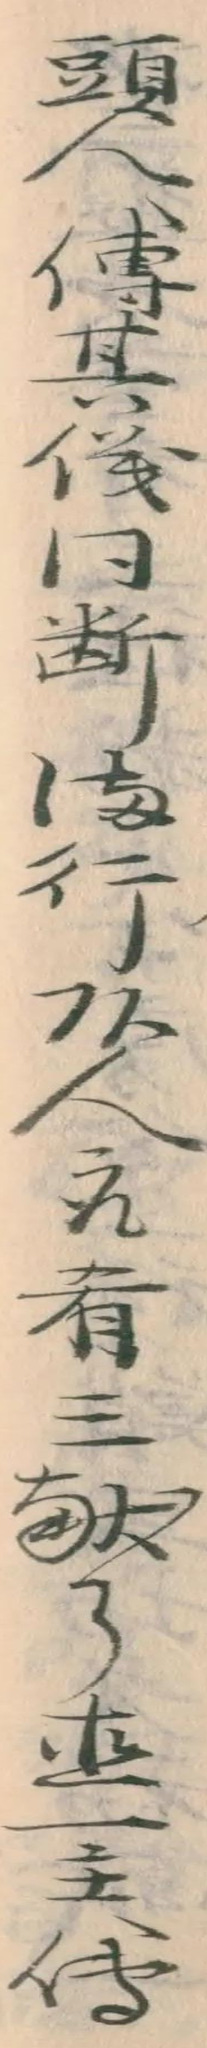頭人ヘ傳其儀同断満行頭人取肴三献了直一主ヘ傳
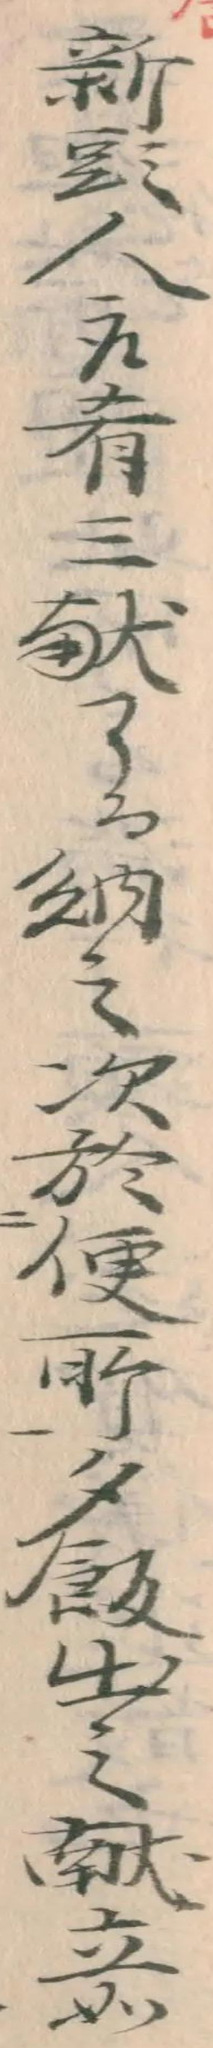新頭人取肴三献了而納之次於便所夕飯出之献立如左
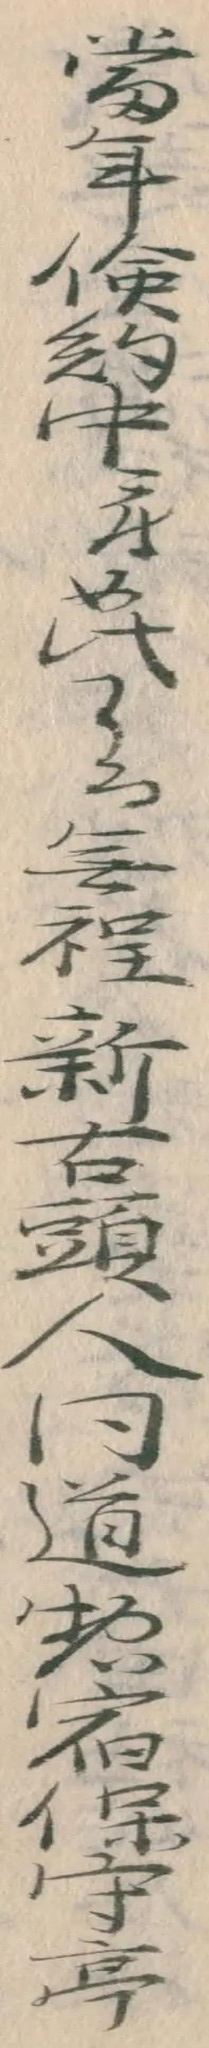當年倹約中ニ付如此了而無程新古頭人同道惣宿保守亭
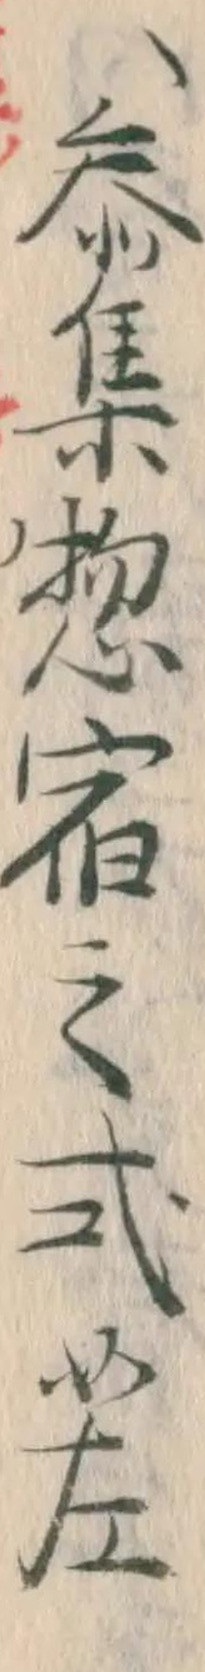ヘ参集惣宿之式如左
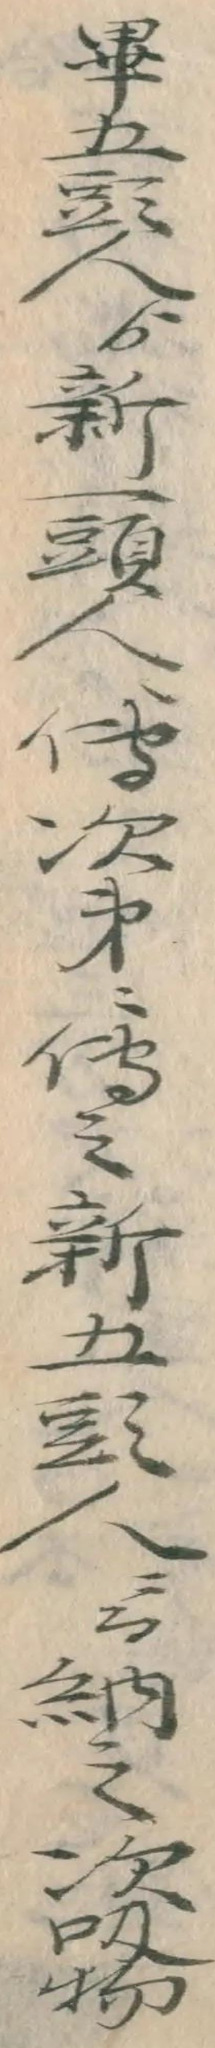畢五頭人ゟ新一頭人へ傳次第に傳之新五頭人ニ而納之次吸物

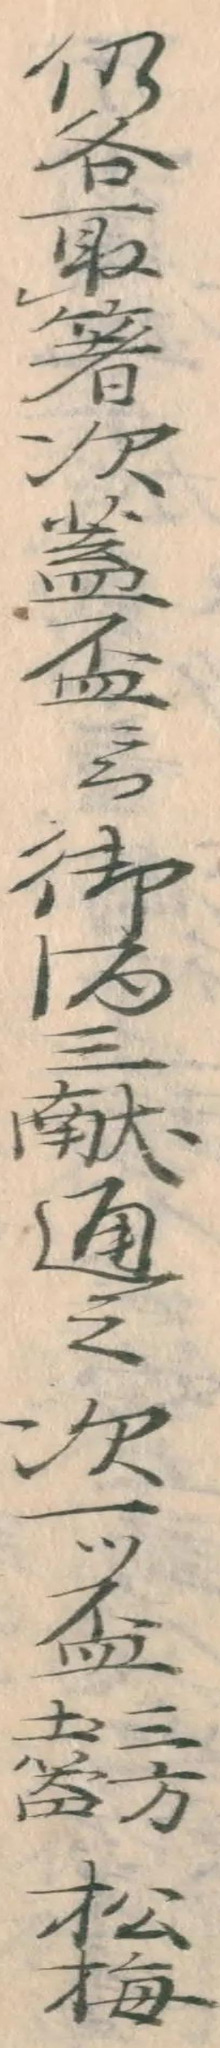仍各取箸次蓋盃ニ而御酒三献通之次一ツ盃三方土器松梅
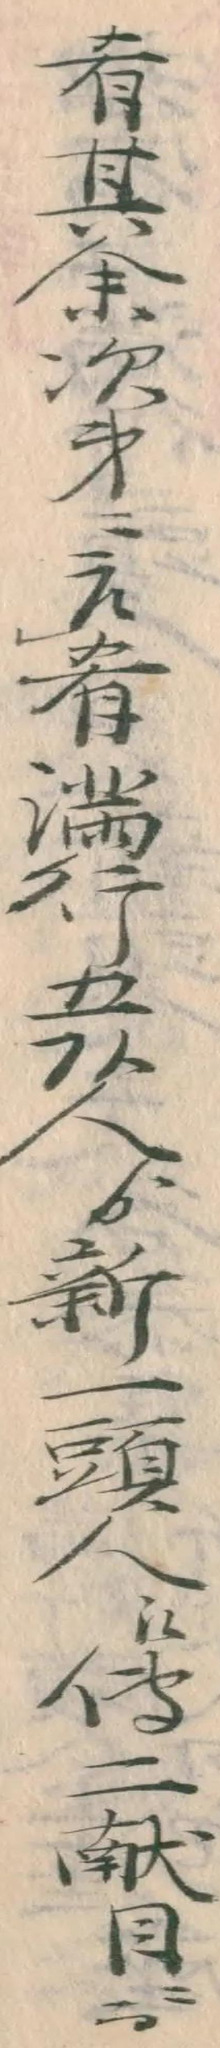肴其余次第ニ取肴満行五頭人ゟ新一頭人え傳二献目ニ而
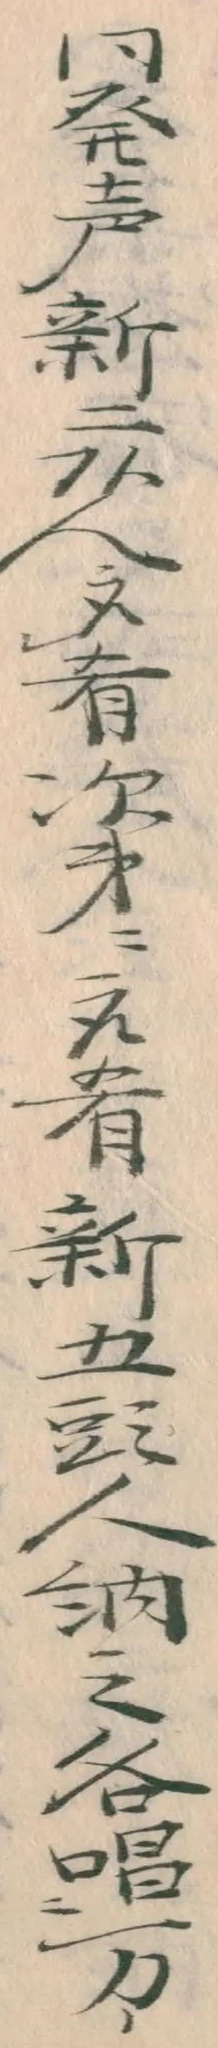同発声新ニ頭人取肴次第ニ取肴新五頭人納之各唱万
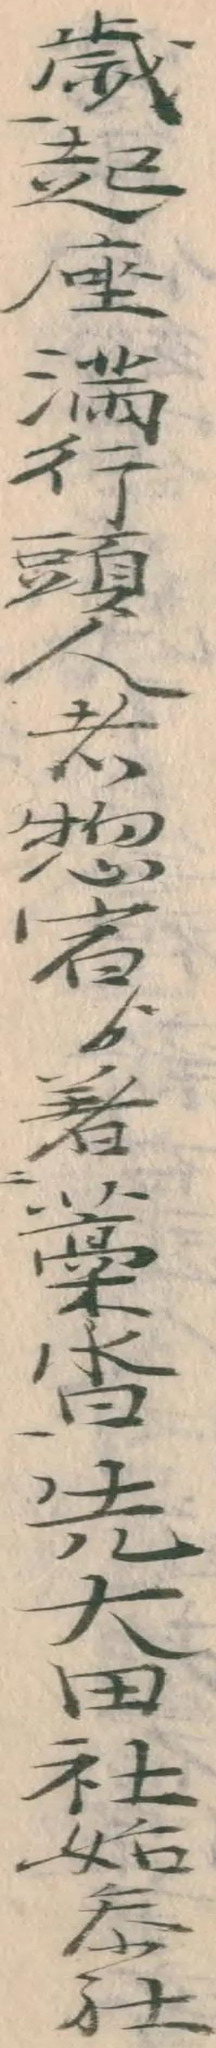歳起座満行頭人者惣宿ゟ着藁沓先大田社始参社
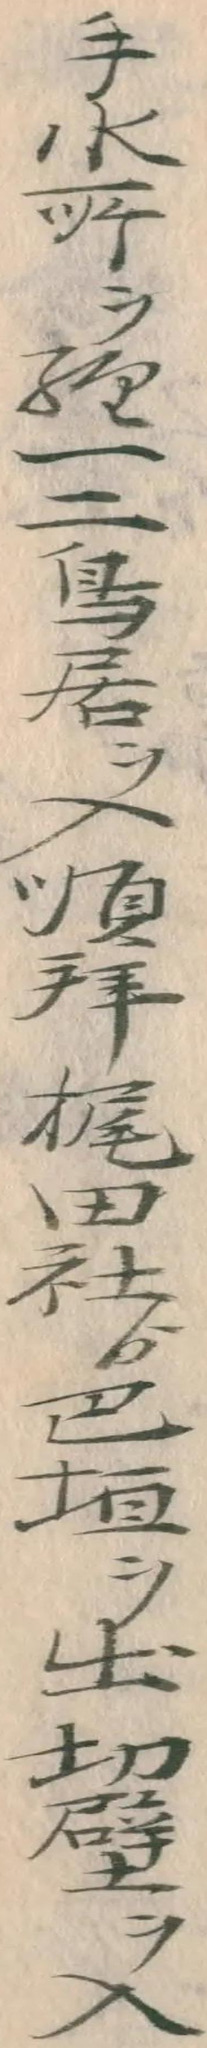手水所を経一二鳥居ヲ入順拝梶田社ゟ巴垣ヲ出切壁ヲ入
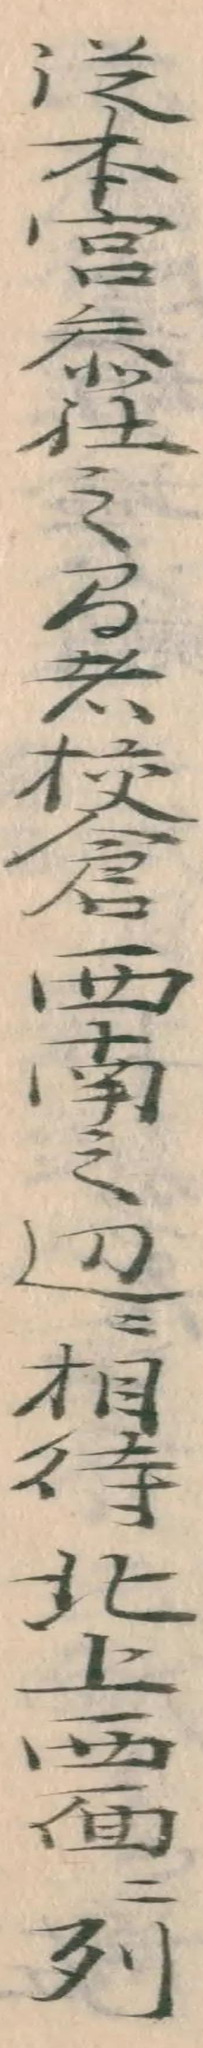従本宮参社之間者校倉西南之辺ニ相待北上西面ニ列
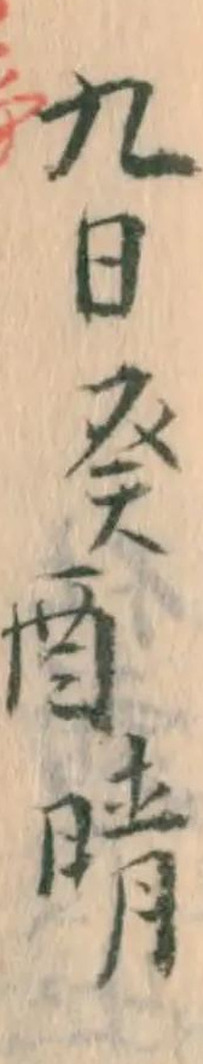九日癸酉晴
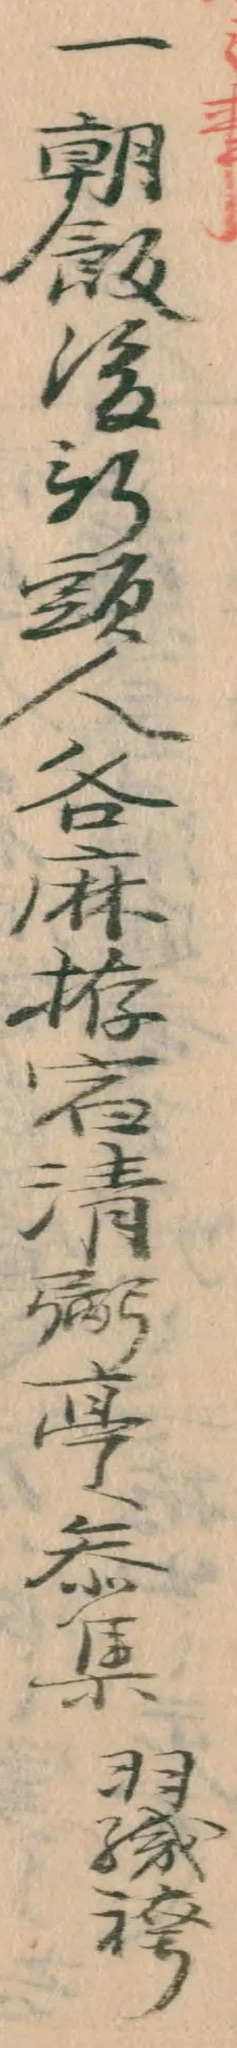一朝飯後新頭人各麻拵宿清弼亭へ参集羽織袴
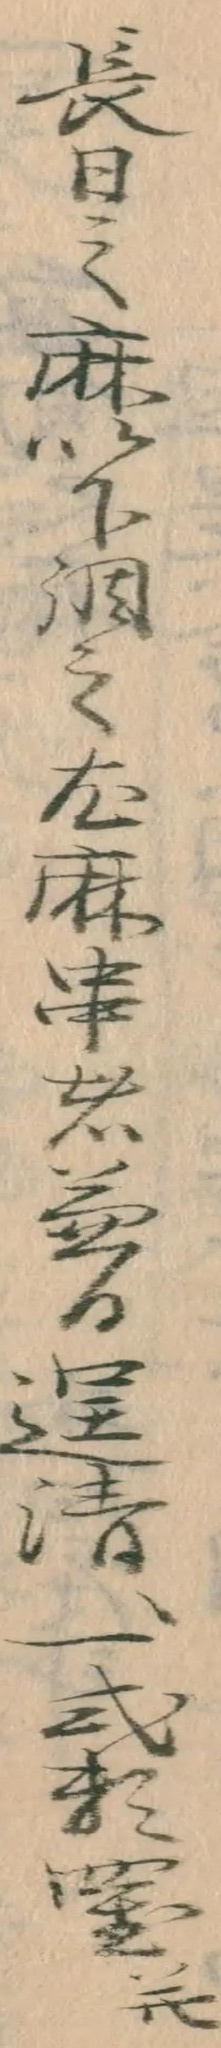長日之麻以下調之尤麻串者兼日逞清へ一式頼置并
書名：賀茂社記録. 第72冊
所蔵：国立国会図書館 National Diet Library, JAPAN
